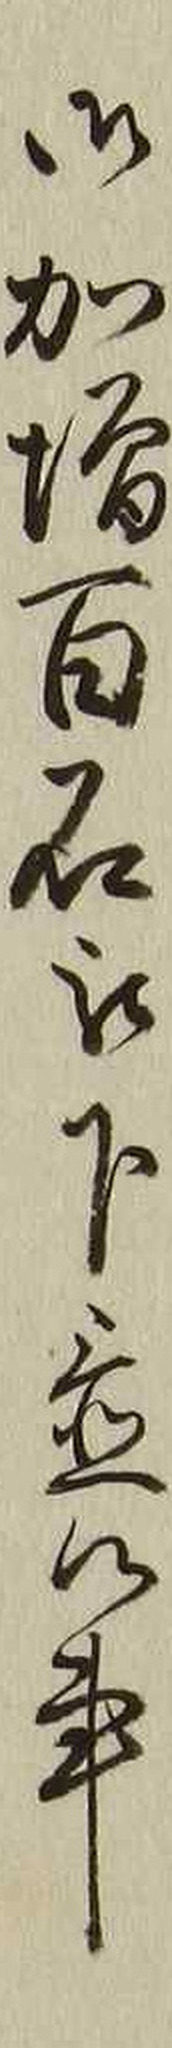候加増百石被下置候事
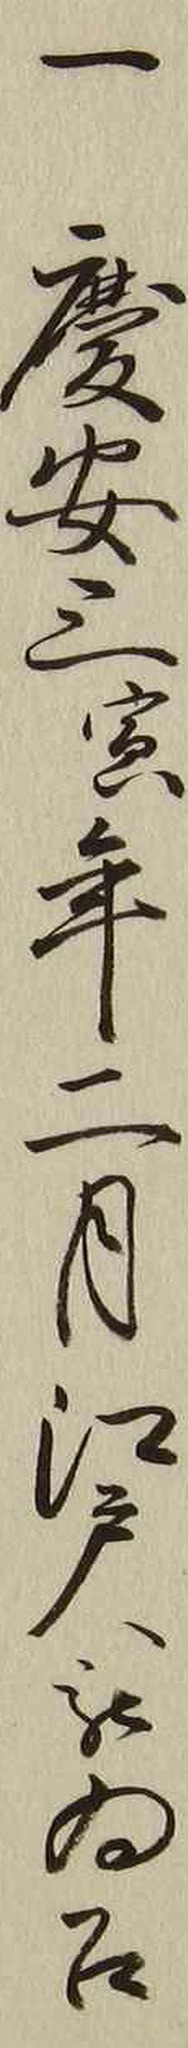一慶安三寅年二月江戸へ被為召
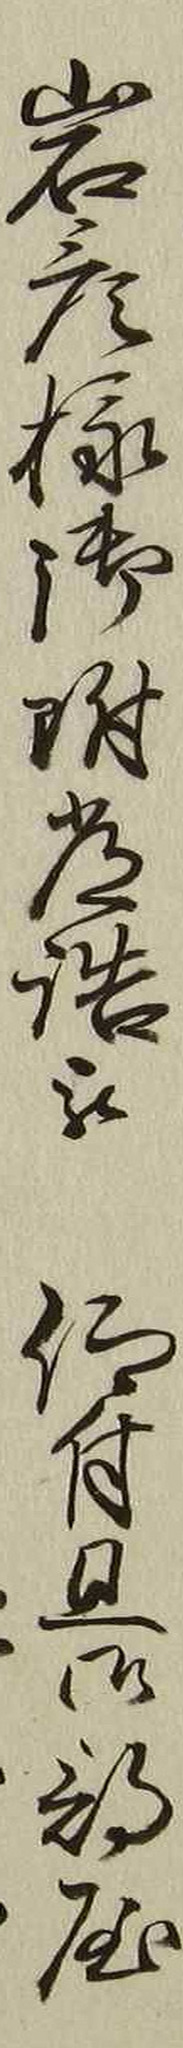岩彦様御付常詰被仰付且御部屋
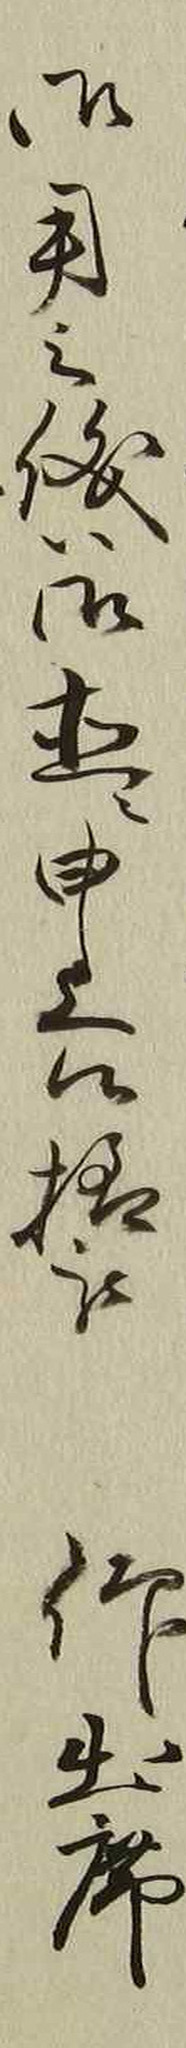御用之儀ハ御直ニ申上候様被仰出席
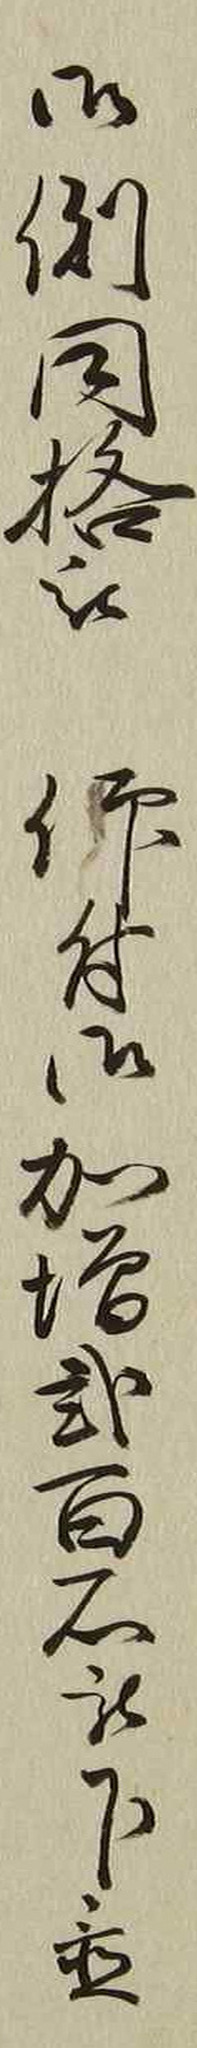御側同格被仰付候加増弐百石被下置
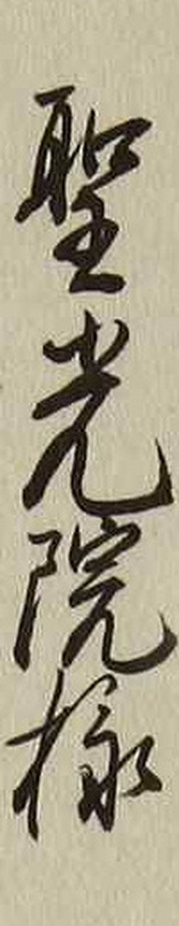聖光院様
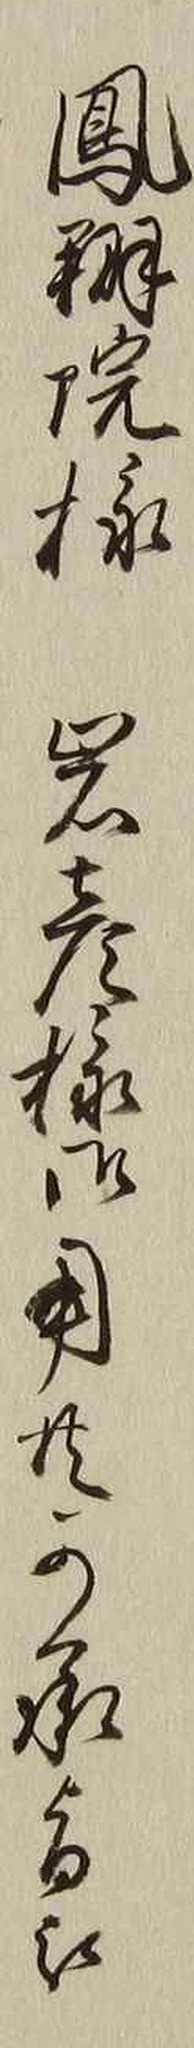鳳翔院様岩彦様御用共可承旨被
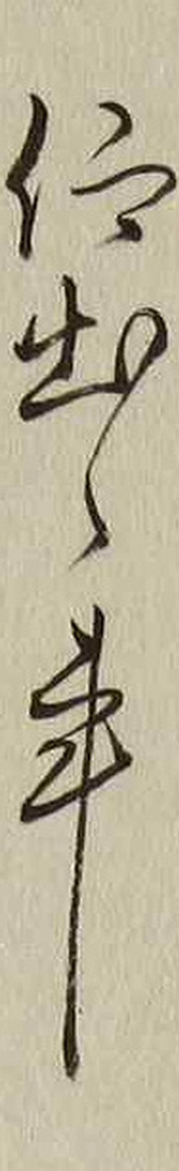仰出候事
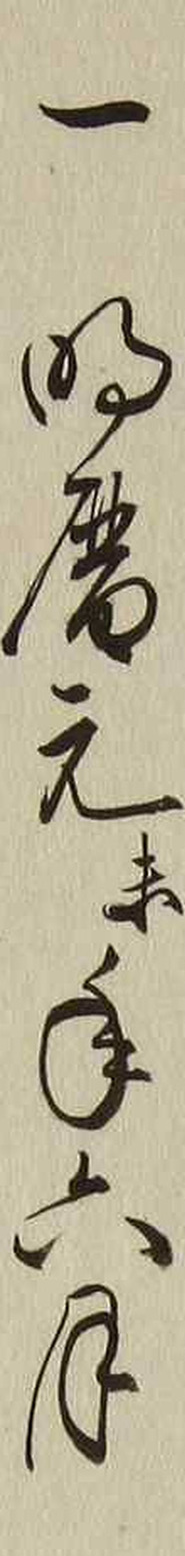一明暦元未年六月
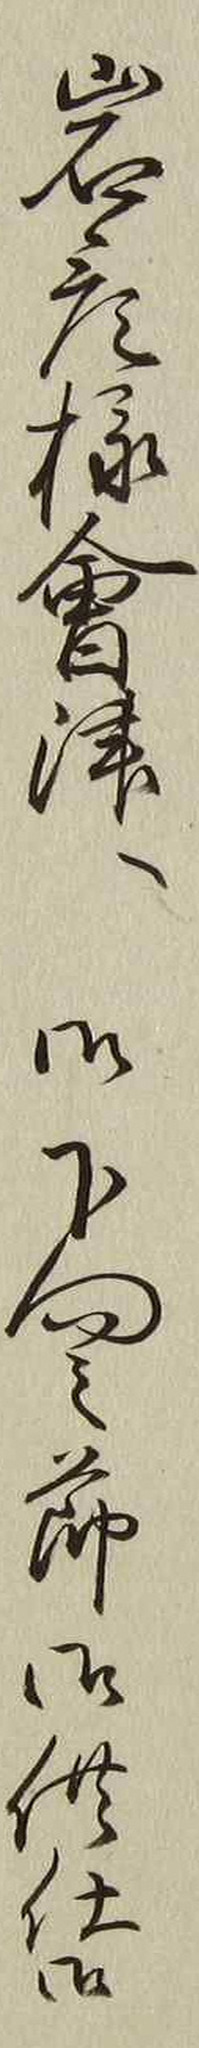岩彦様会津へ被下向之節御供仕御
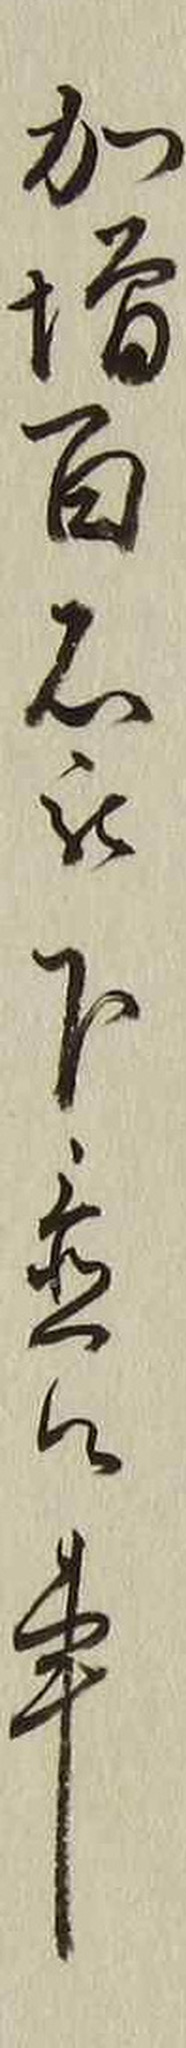加増百石被下置候事
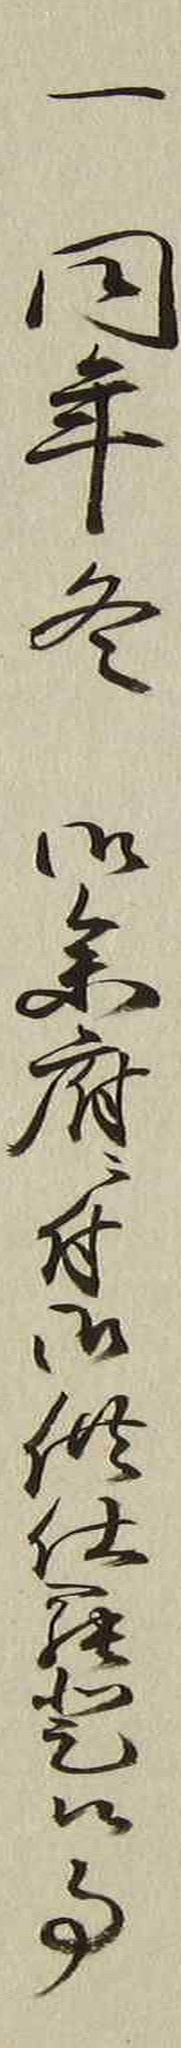一同年冬御参府ニ付御供仕罷登候事
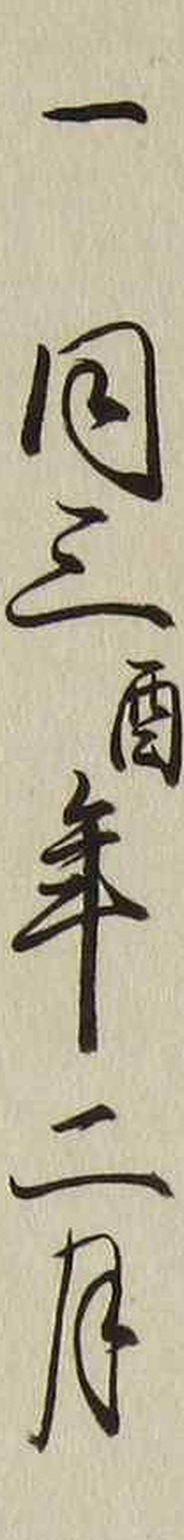一同三酉年二月
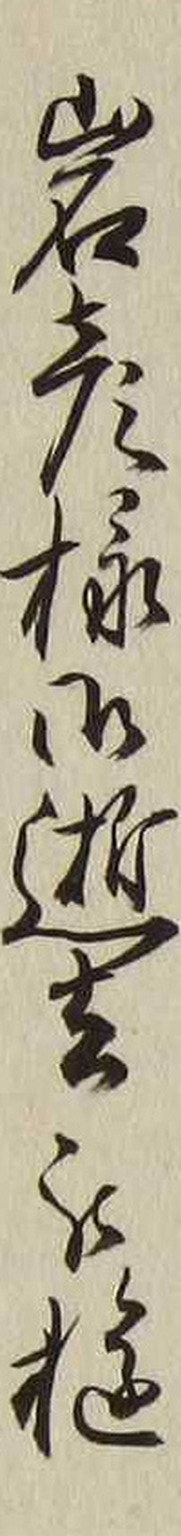岩彦様御逝去被遊
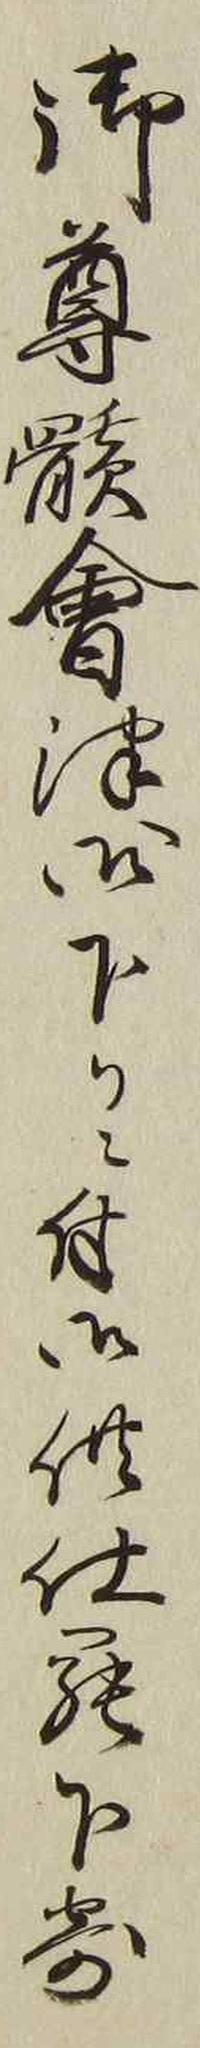御尊骸会津へ御下りニ付御供仕罷下寄

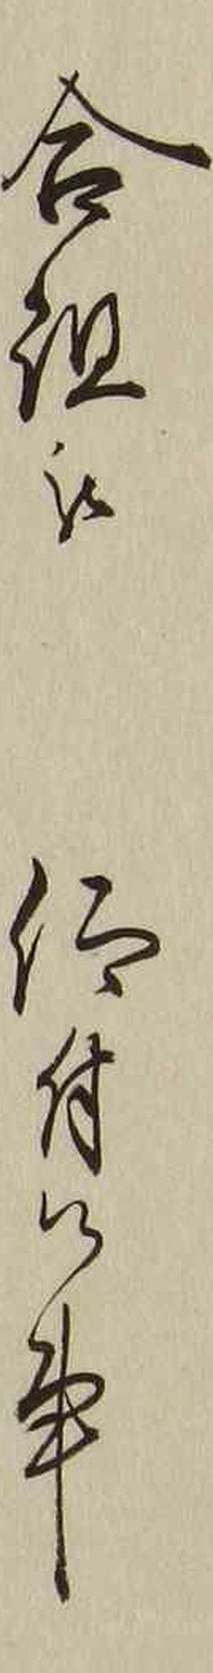合組被仰付候事
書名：諸士系譜　巻之21　い之部21
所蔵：会津若松市立会津図書館
